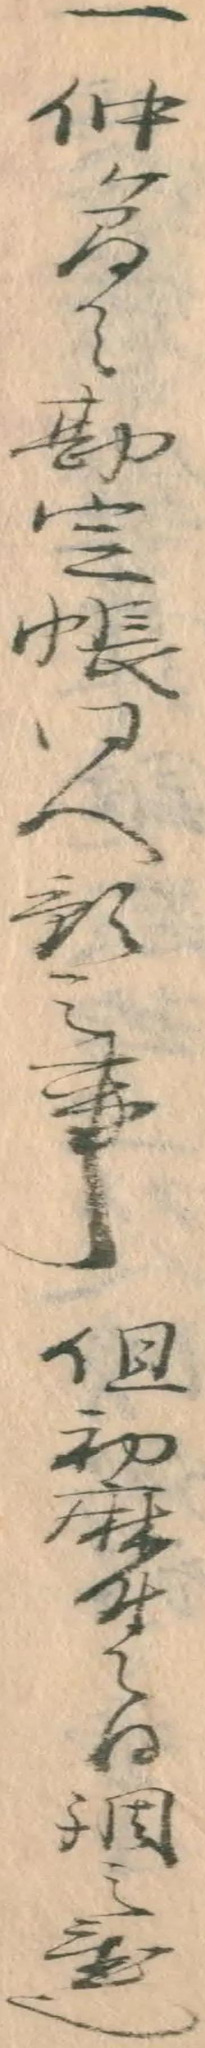一仲ヶ間之勘定帳同人預之事但初麻付之日調之置也
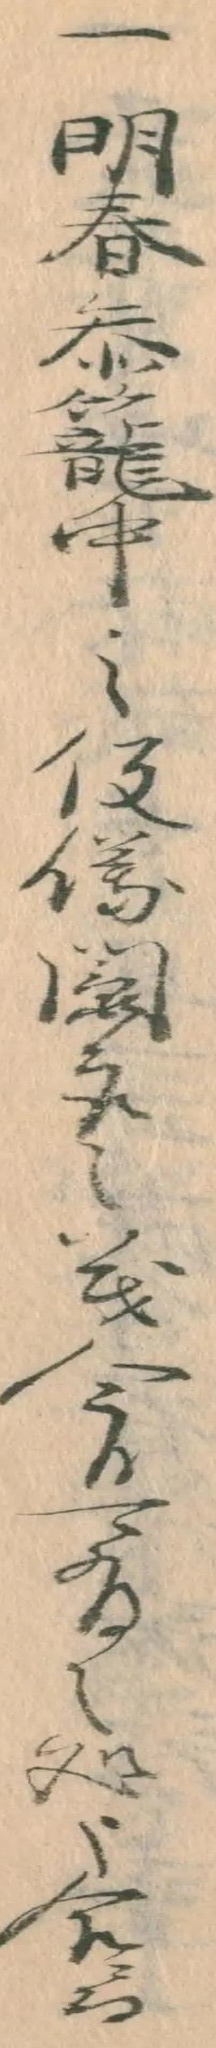一明春参籠中之役儀鬮取之義今日可有之処申合ニ而
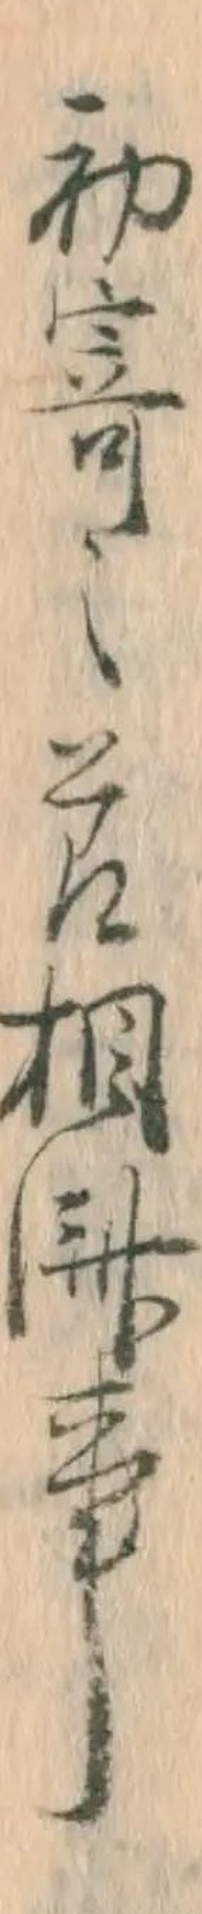初寄之節相済事
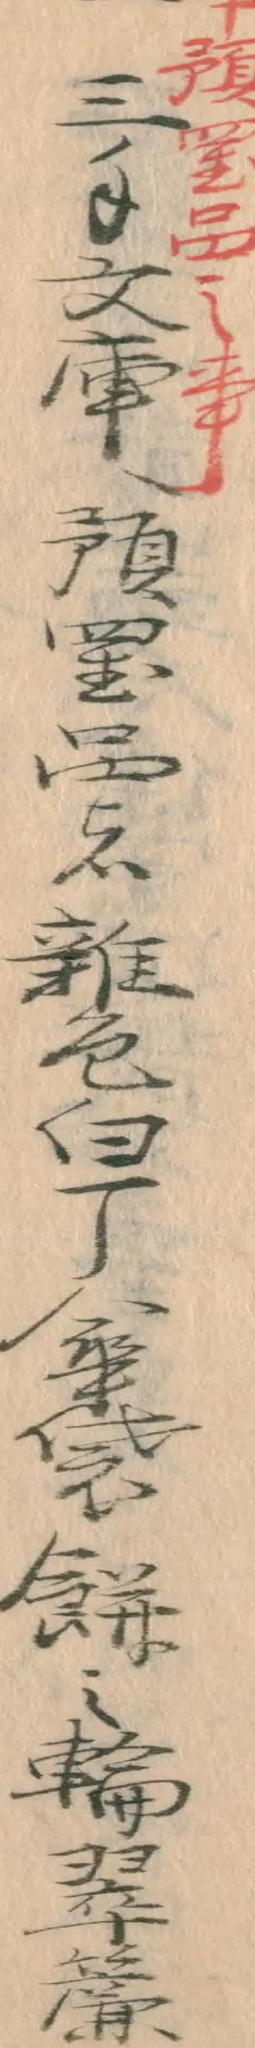一三手文庫へ預置品者雑色白丁傘袋餅之輪翠簾
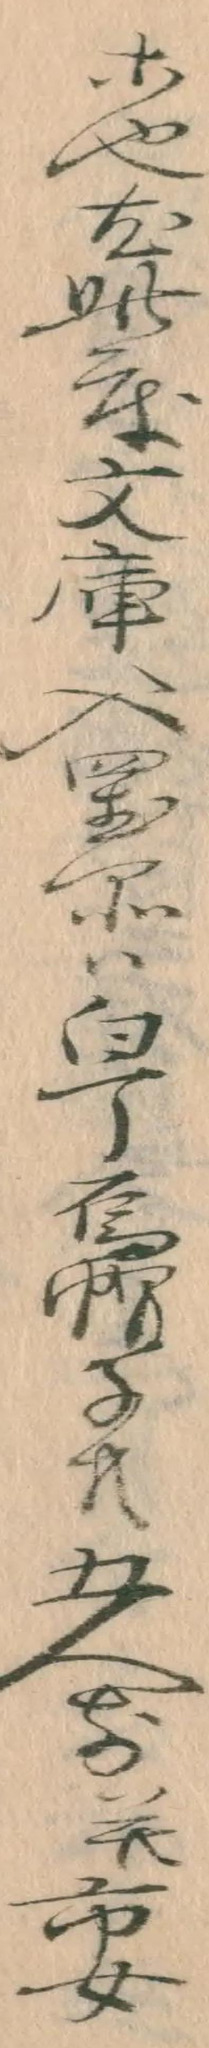等也尤此度文庫へ入置所ハ白丁烏帽子共五人前并市女
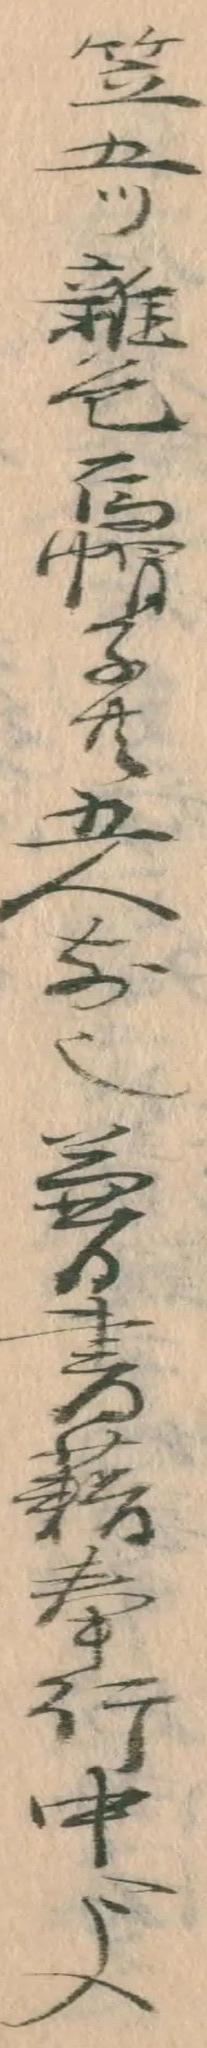笠五ツ雑色烏帽子共五人前也兼日書籍奉行中へ申入
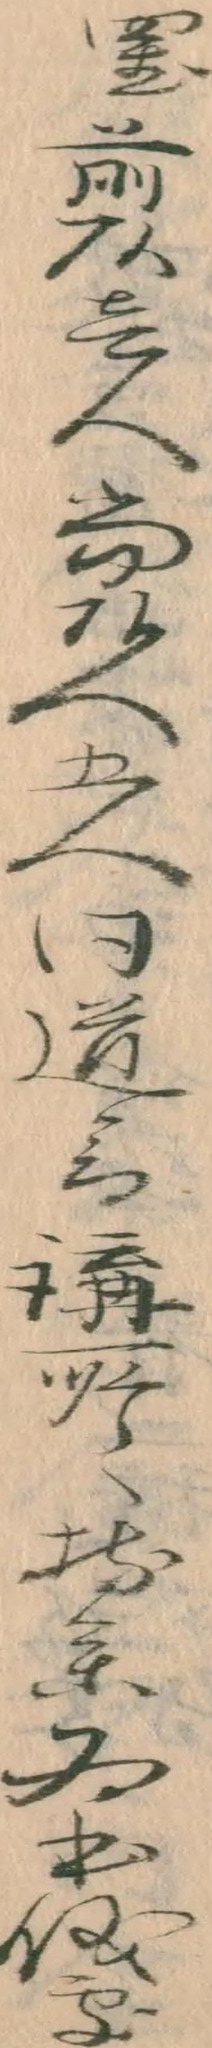置前頭壱人當頭人五人同道二而講所へ持参為本儀處
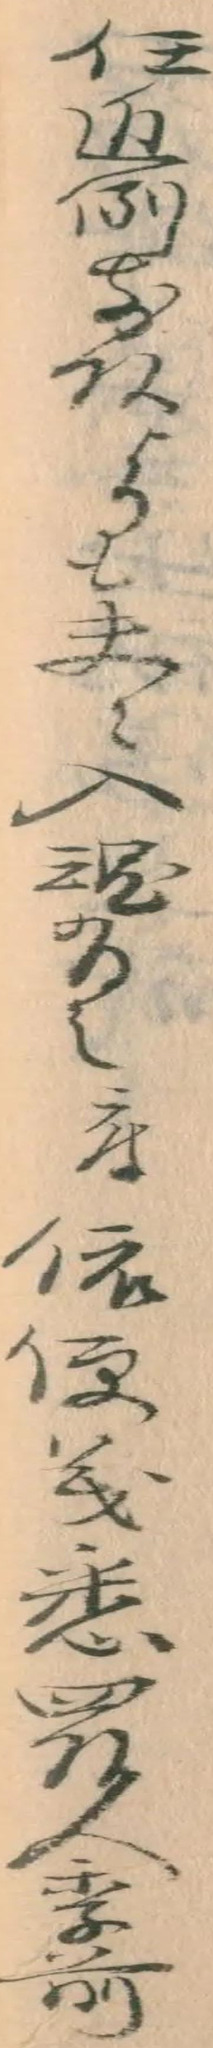仕近例前頭よりも夫々入魂有之ニ付依便義悉四頭人季前
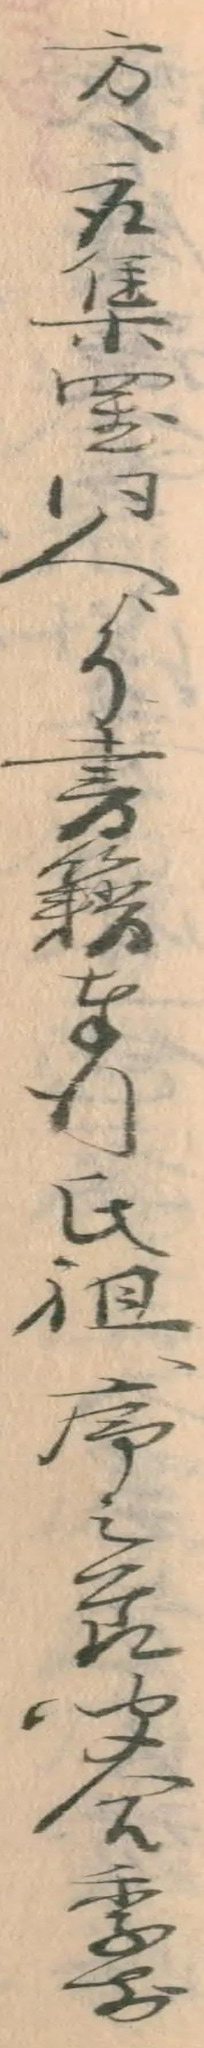方へ取集置同人より書籍奉行氏祖ヘ序之節聞合季前
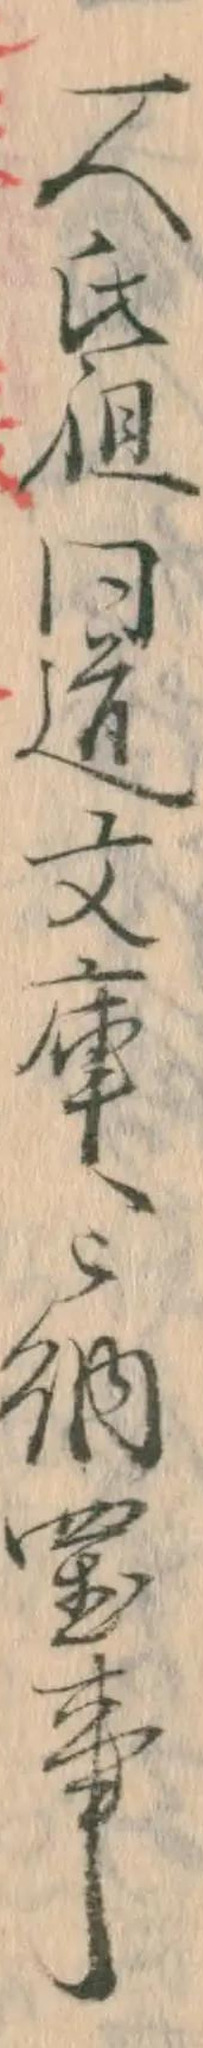一人氏但同道文庫へ被納置事
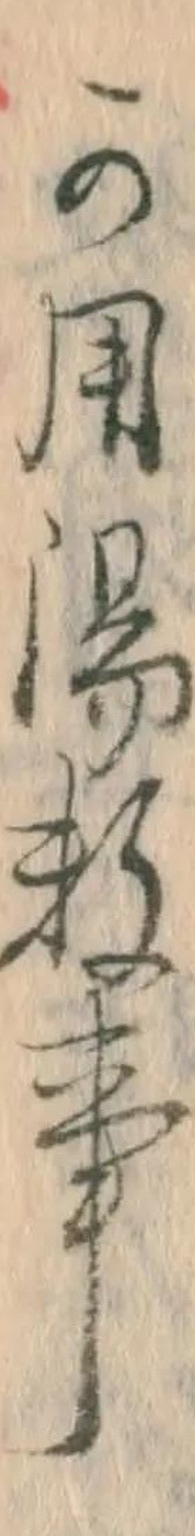可用湯数事
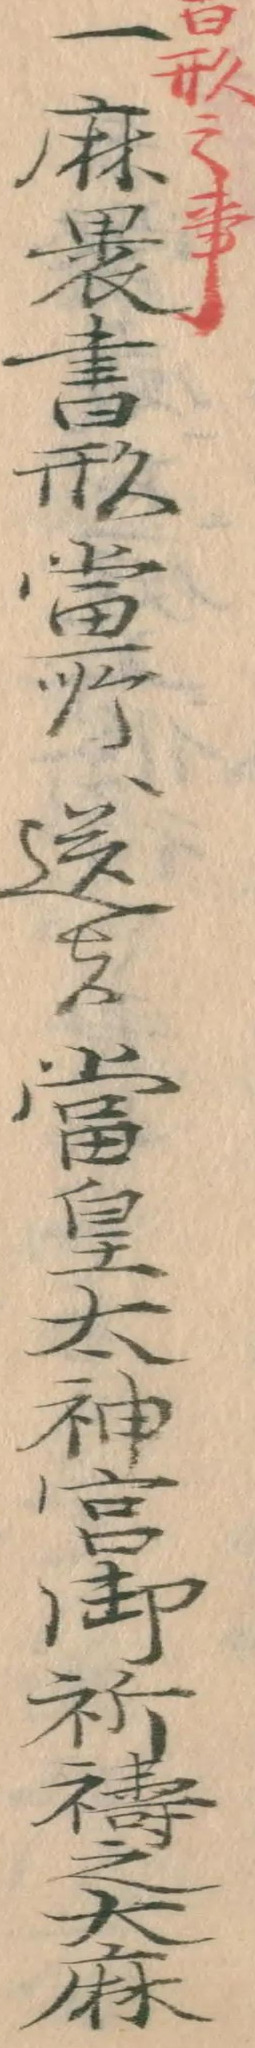一麻包書形當所へ送者當皇太神宮御祈祷之大麻
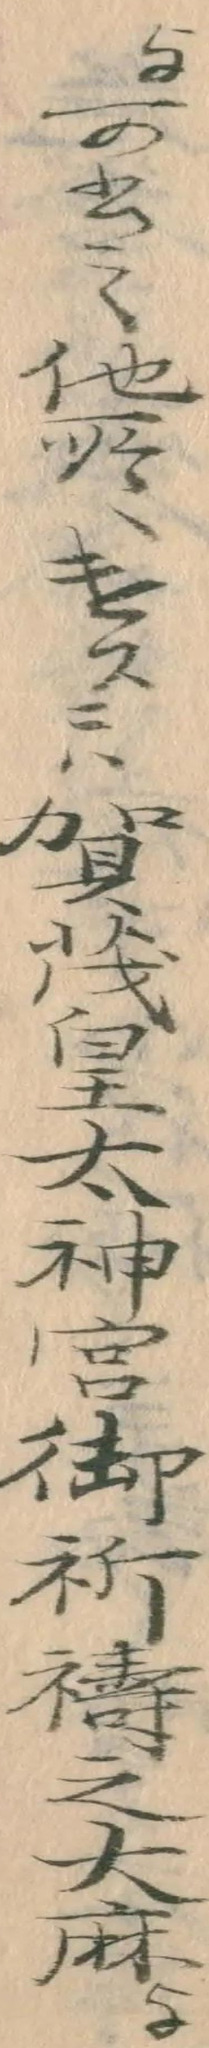与可書之他所へ遣スニハ賀茂皇太神宮御祈祷之大麻与
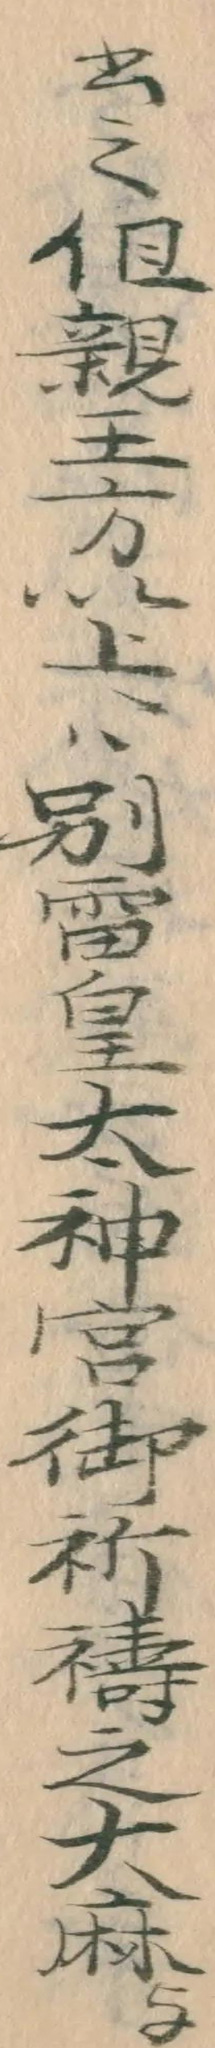書也但親王方以上ヘハ別雷皇太神宮御祈祷之大麻与
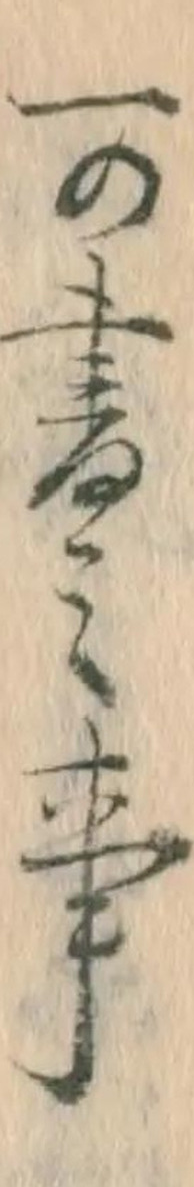可書之事
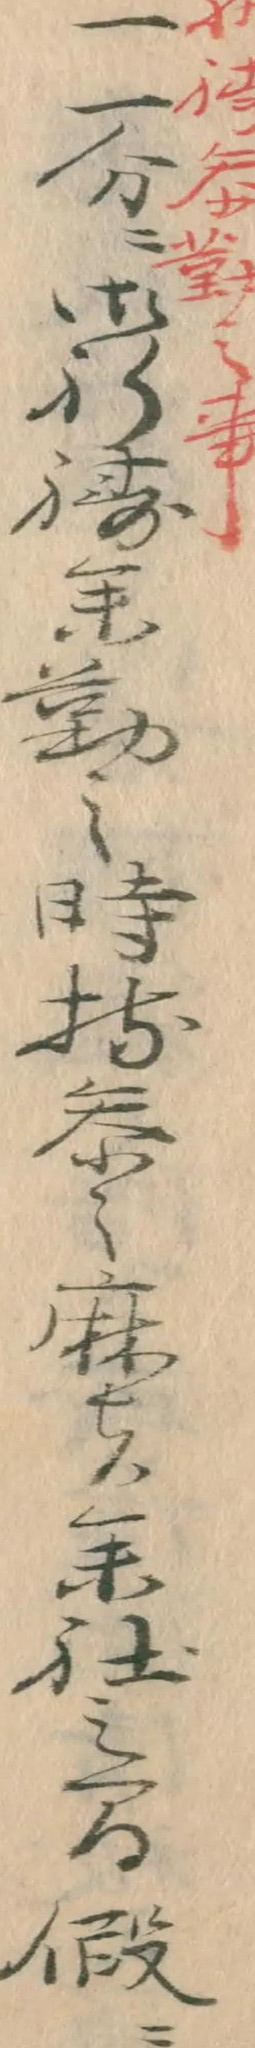一一分ニ御祈祷参勤之時持参之麻者参社之間假ニ
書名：賀茂社記録. 第72冊
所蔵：国立国会図書館 National Diet Library, JAPAN
